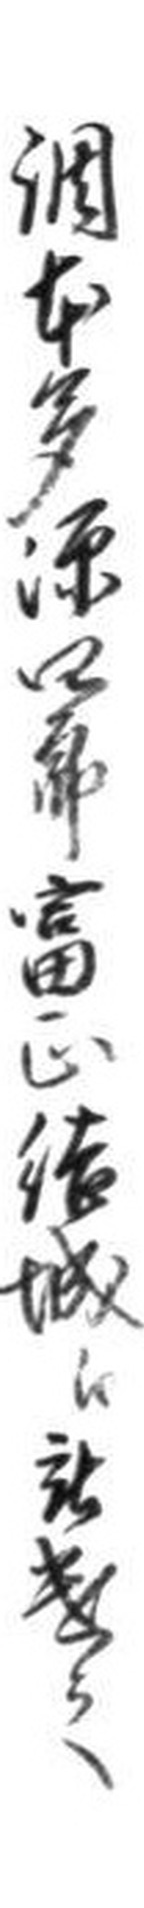調本多源四郎富正結城江被遣之
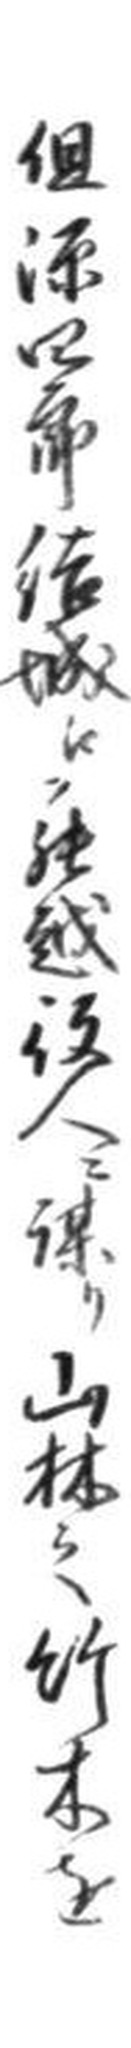但源四郎結城江罷越役人ニ謀り山林之竹木を
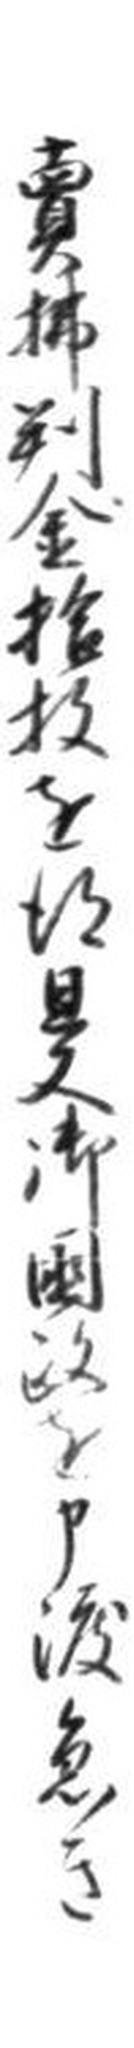売払判金拾枚を得且又御国政を申渡急き
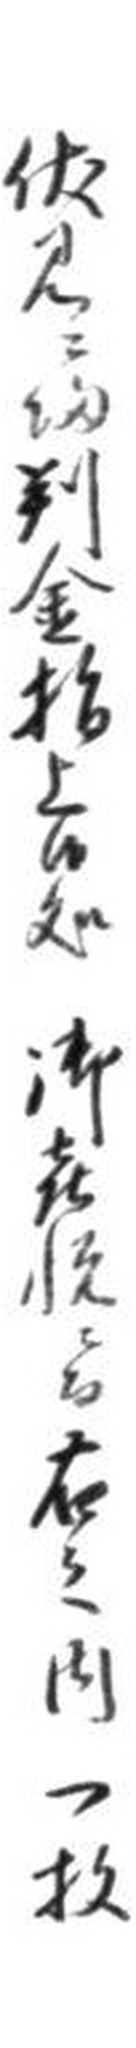伏見ニ帰判金指上候処御喜悦ニ而右之内一枚
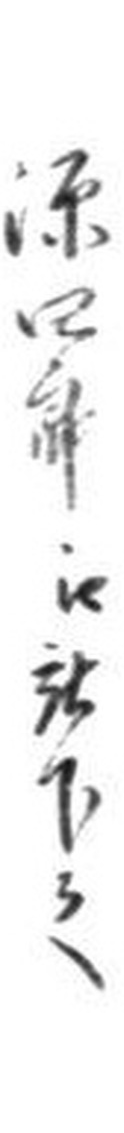源四郎江被下之
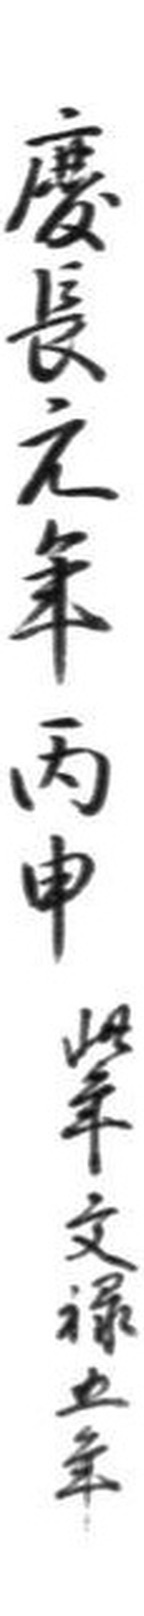慶長元年丙申此年文禄五年
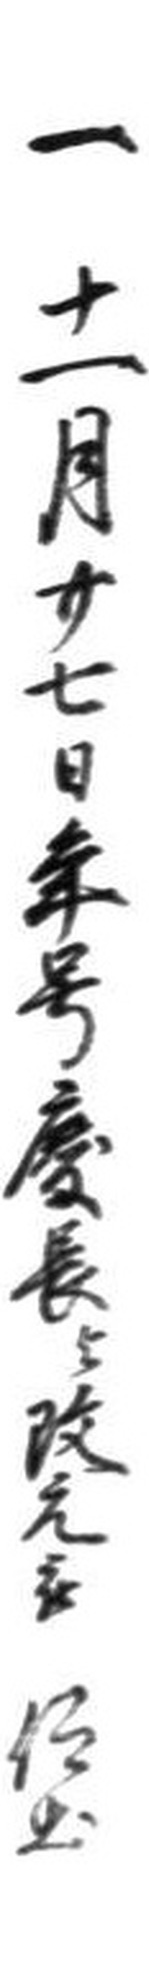一十一月廿七日年号慶長と改元被仰出

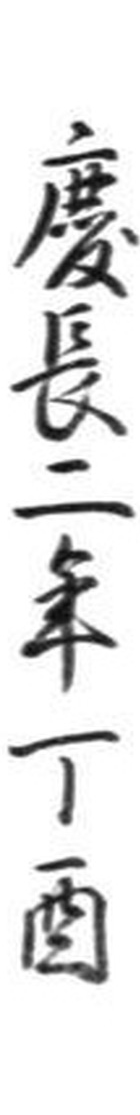慶長二年丁酉
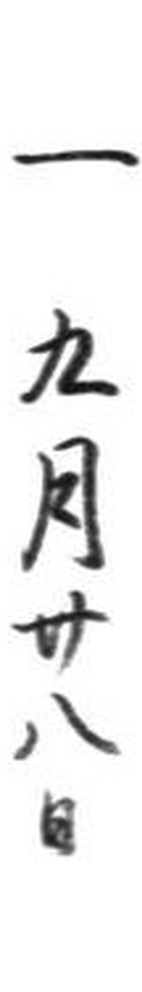一九月廿八日

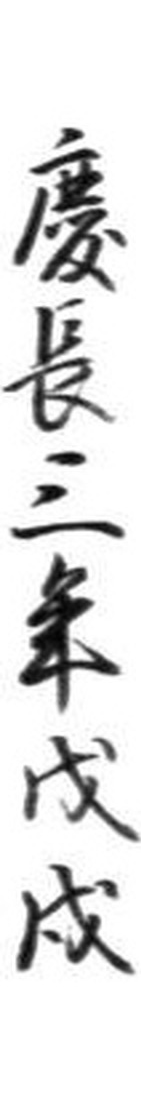慶長三年戊戌
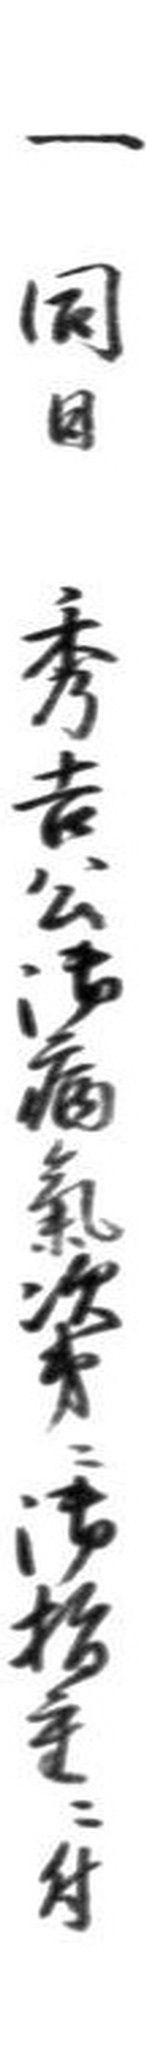一同日秀吉公御病気次第ニ御指重ニ付
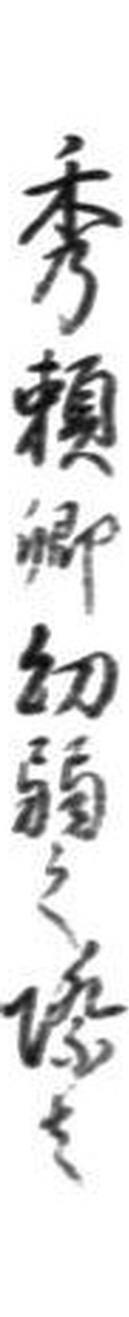秀頼卿幼弱之際者
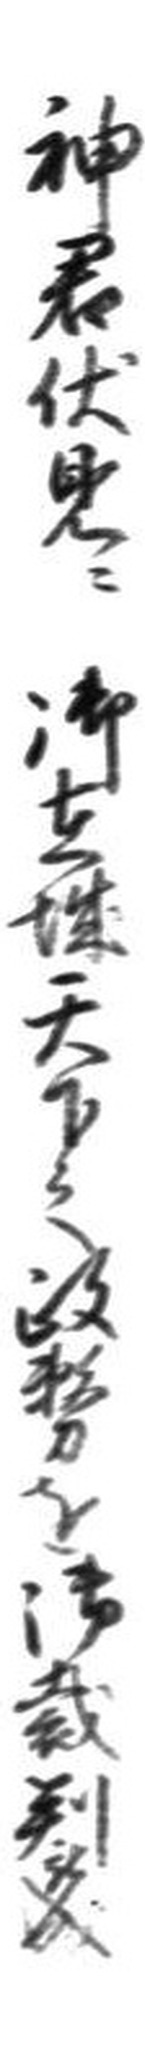神君伏見ニ御在城天下之政務を御裁判被成
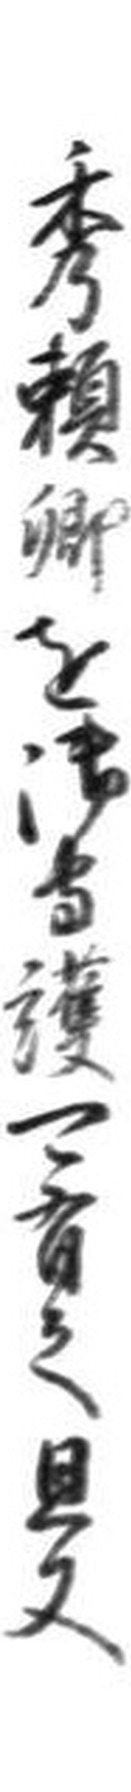秀頼卿を御守護可有之且又
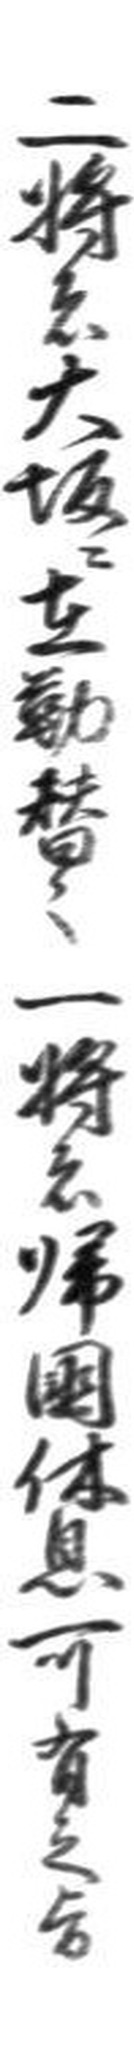二将者大坂ニ在勤替々一将者帰国休息可有之旨

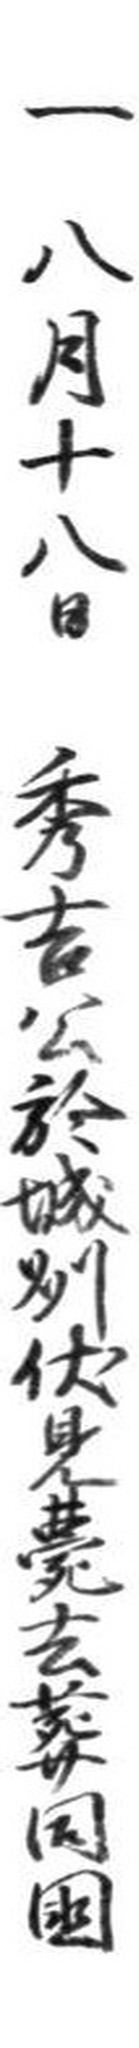一八月十八日秀吉公於城州伏見薨去葬同国
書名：家譜 一 秀康公 従天正二年到慶長十二年
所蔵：福井県文書館 Fukui Prefectural Archives
